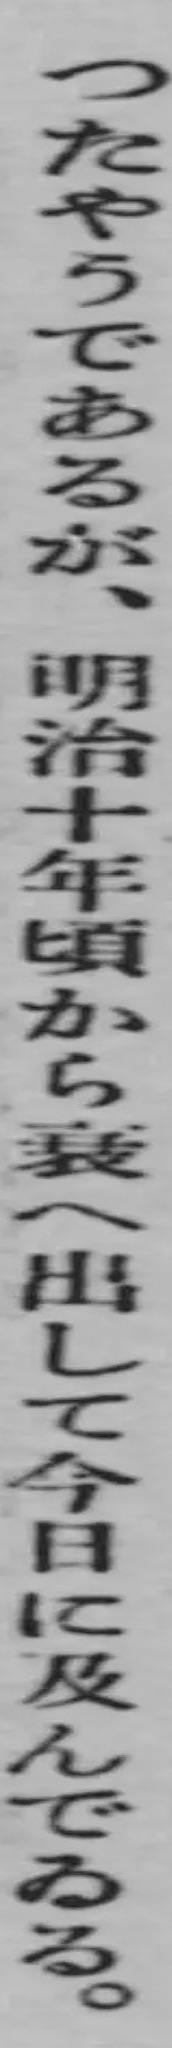つたやうであるが、明治十年頃から衰へ出して今日に及んでゐる。
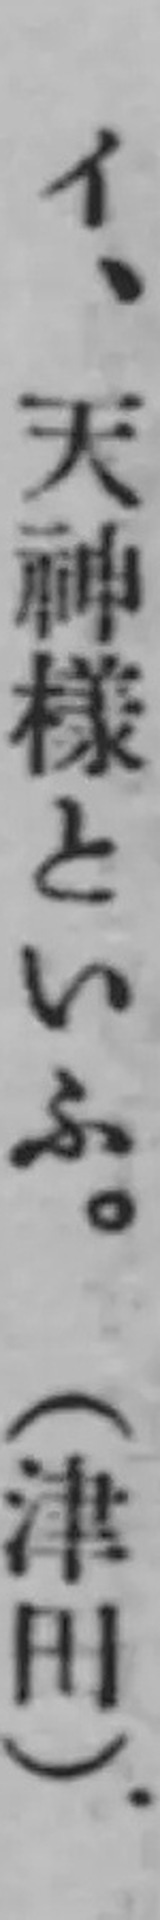イ、天神様といふ。(津田)
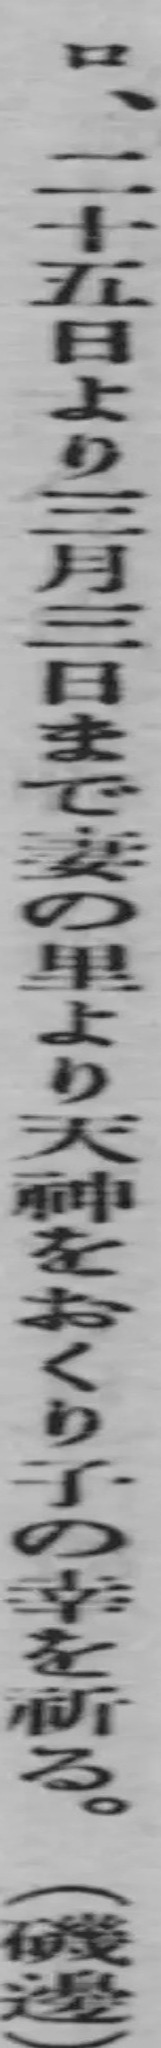ロ、二十五日より三月三日まで妻の里より天神をおくり子の幸を祈る。(磯邊)

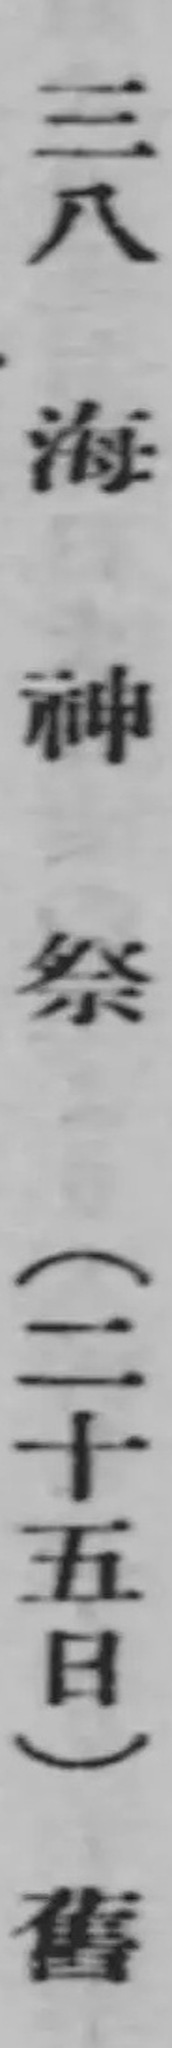三八海神祭(二十五日)舊
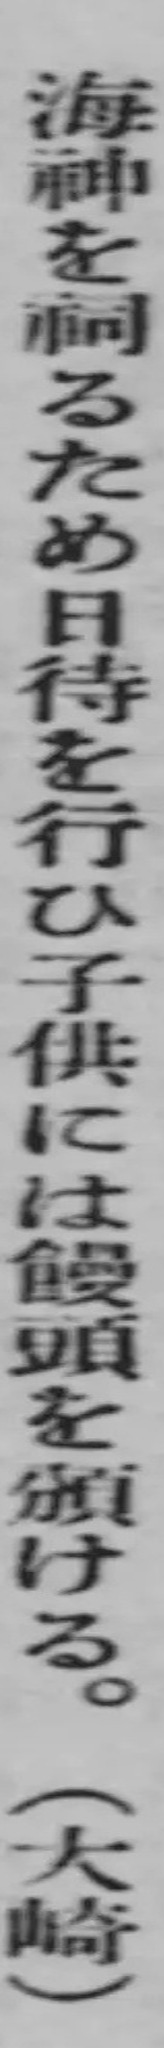海神を祠るため日待を行ひ子供には饅頭を頒ける。(大崎)
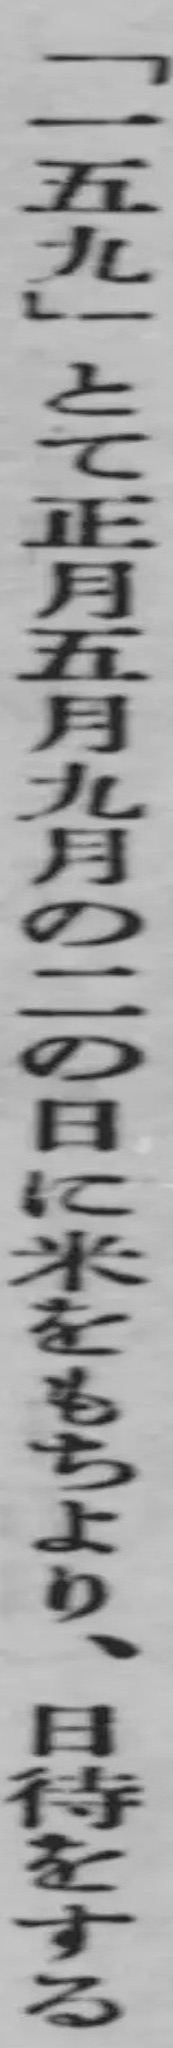「一五九」とて正月五月九月の二の日に米をもちより、日待をする
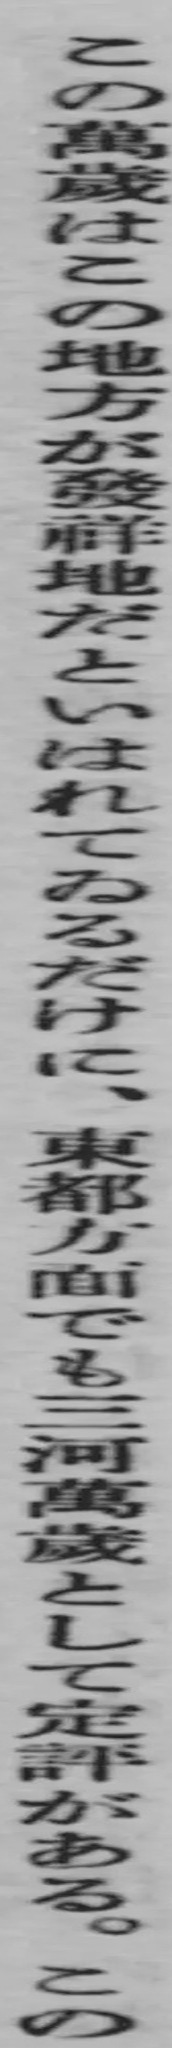この萬歲はこの地方が發祥地だといはれてゐるだけに、東都方面でも三河萬歲として定評がある。この
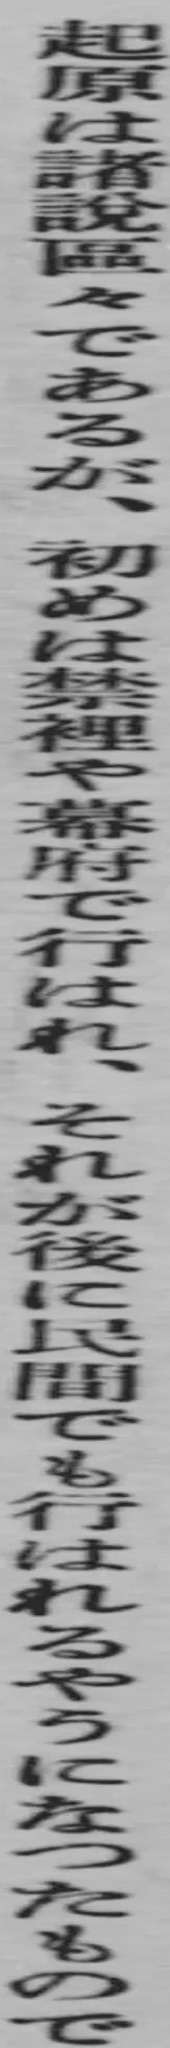起原は所說區々であるが、初めは禁裡や幕府で行はれ、それが後に民間でも行はれるやうになつたもので
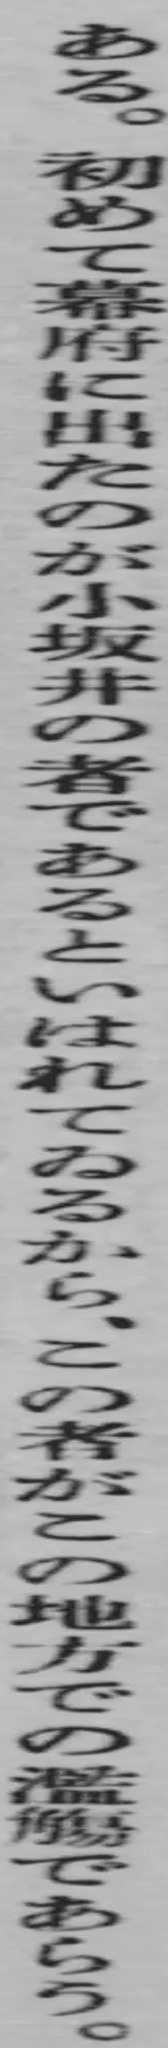ある。初めて幕府に出たのが小坂井の者であるといはれてゐるから、この者がこの地方での濫觴であらう。
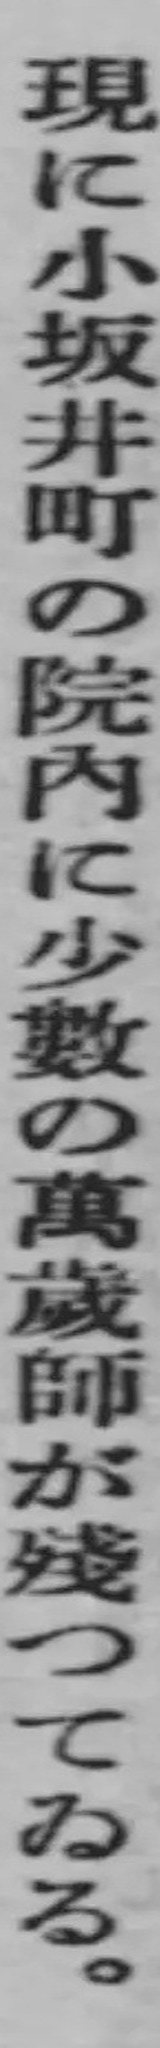現に小坂井町の院内に少數の萬歲師が殘つてゐる。
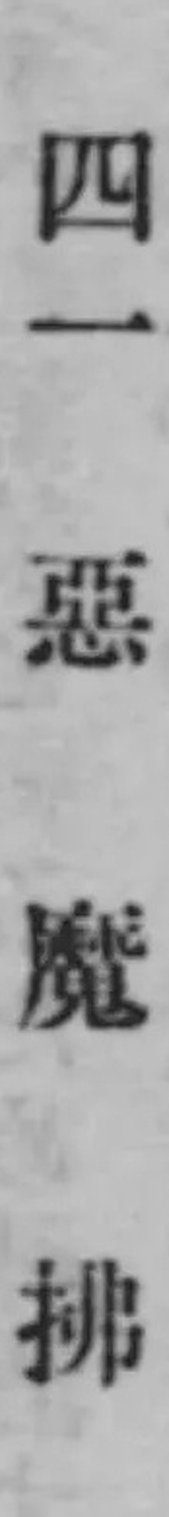四一惡魔拂
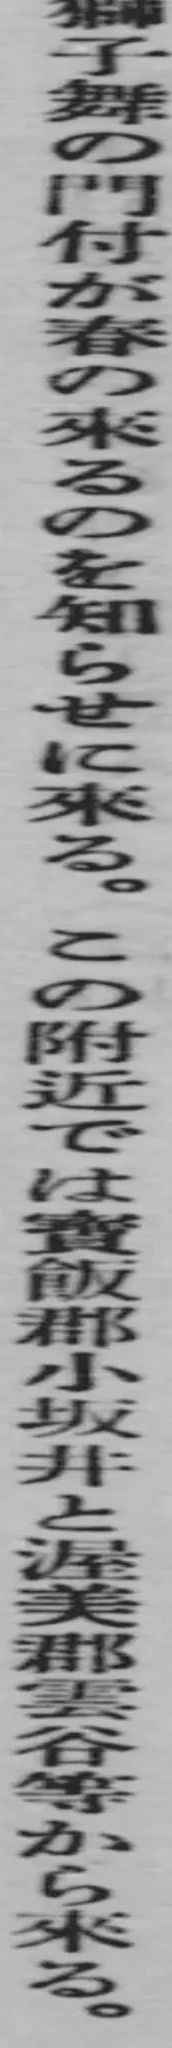獅子舞の門付が春の來るのを知らせに來る。この附近では寶飯郡小坂井と渥美郡雲谷等から來る。
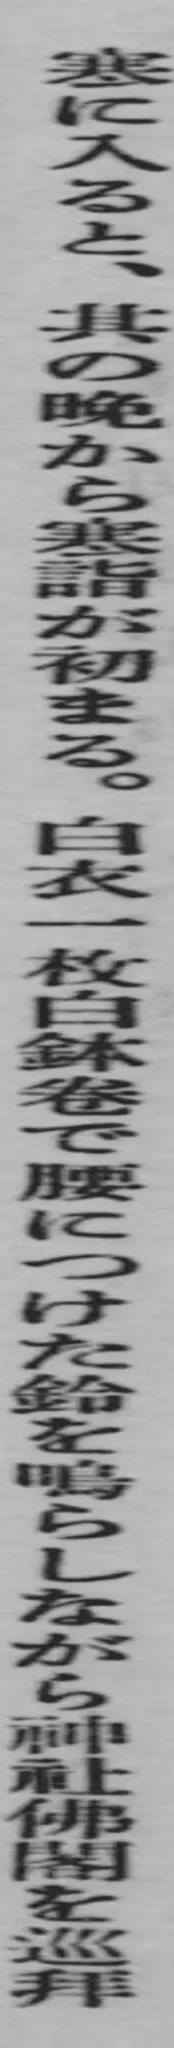寒に入ると、其の晩から寒詣が始まる。白衣一枚白鉢卷で腰につけた鈴を鳴らしながら神社佛閣を巡拜
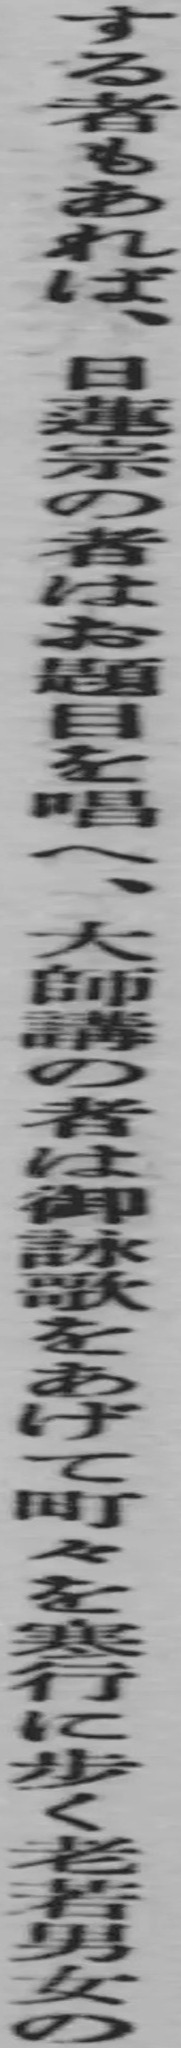する者もあれば、日蓮宗の者はお題目を唱へ、大師講の者は御詠歌をあげて町々を寒行に歩く老若男女の
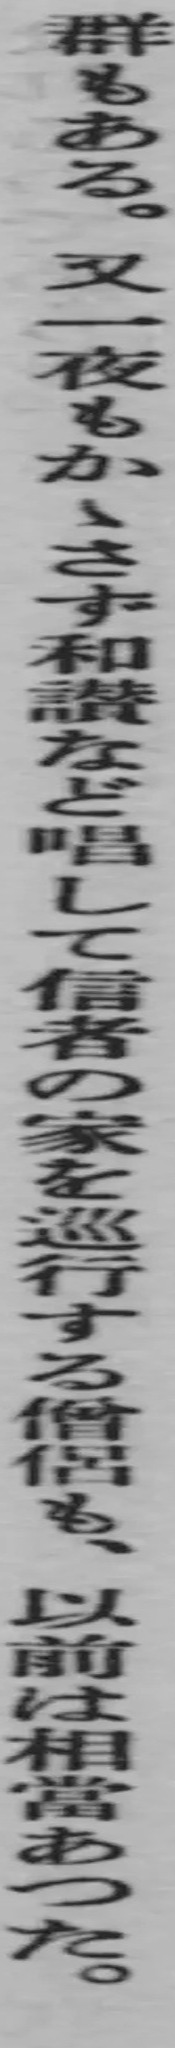群もある。又一夜もかゝさず和讃など唱して信者の家を巡行する僧侶も、以前は相當あつた。
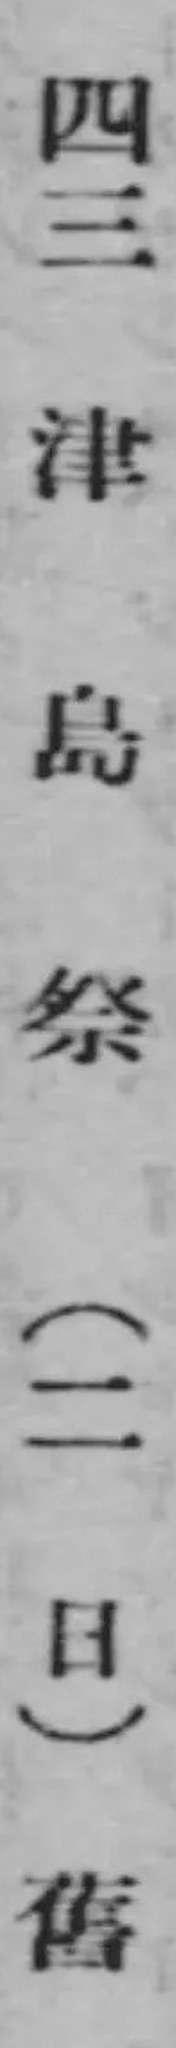四三津島祭(二日)舊
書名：豊橋の年中行事
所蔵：国立国会図書館 National Diet Library, JAPAN
